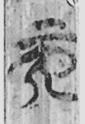而
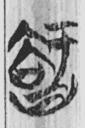智
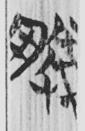朕
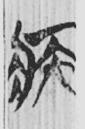疾
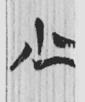少
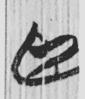臣
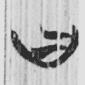曰
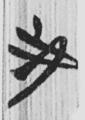我
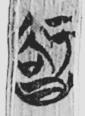智
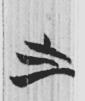之
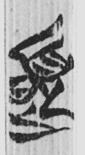{日止頁}（夏）
